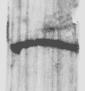一
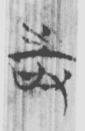𠱾
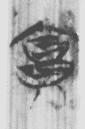實
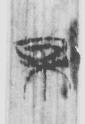果
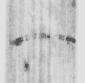一
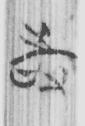𠱾
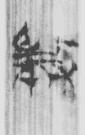殺
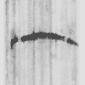一
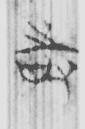𠱾
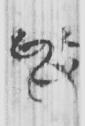收
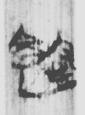{食念}
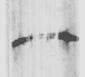一
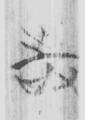𠱾
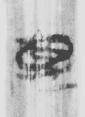惪
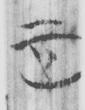正
